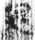貞（鼎）
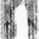八
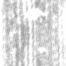才（在）
